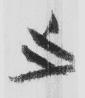之
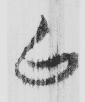㠯（以）
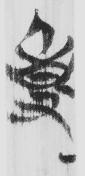事
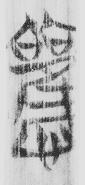懽
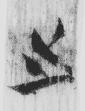之
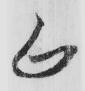㠯（以）
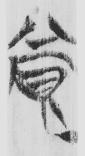賞
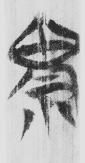{鬼示}
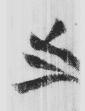之
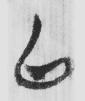㠯（以）
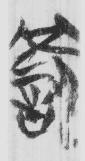罰
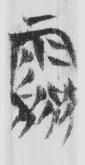{霝㐺}
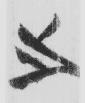之
